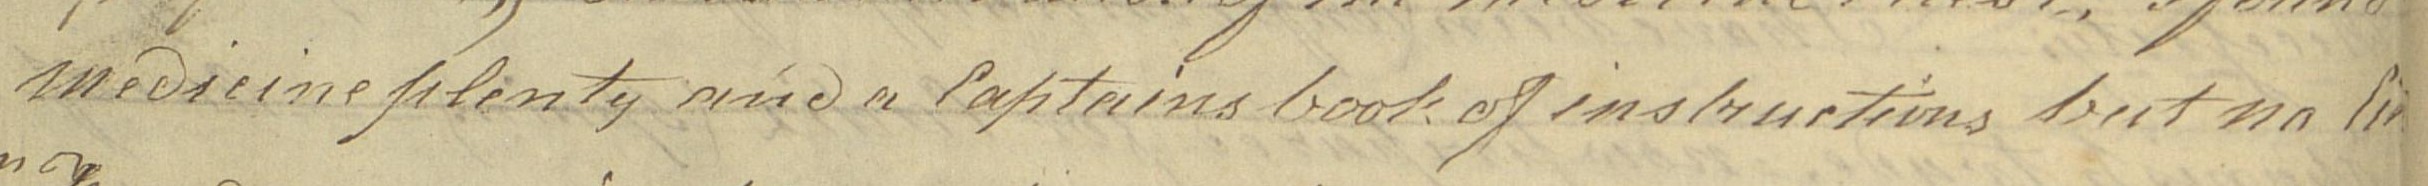medicine plenty and a Captains book of instructions but no he-
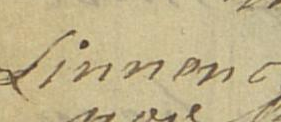Linnen
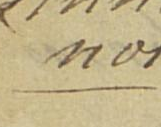nor
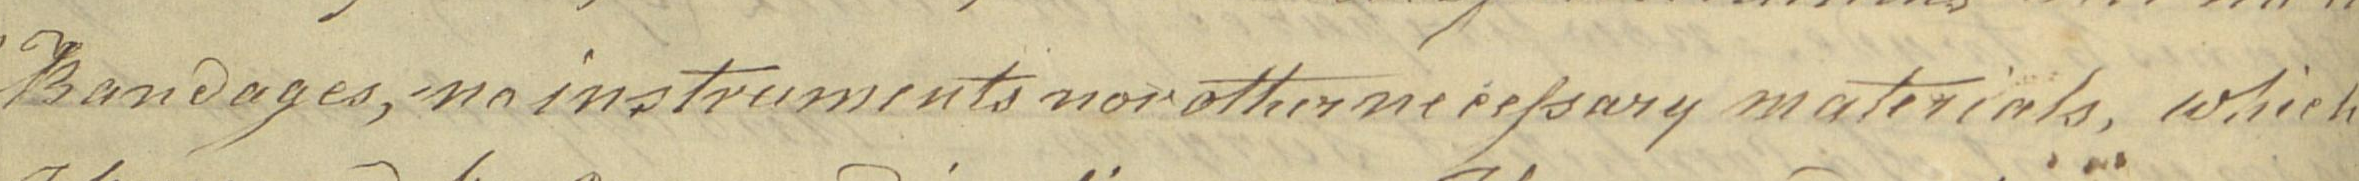Bandages, no instruments nor other necessary materials, which
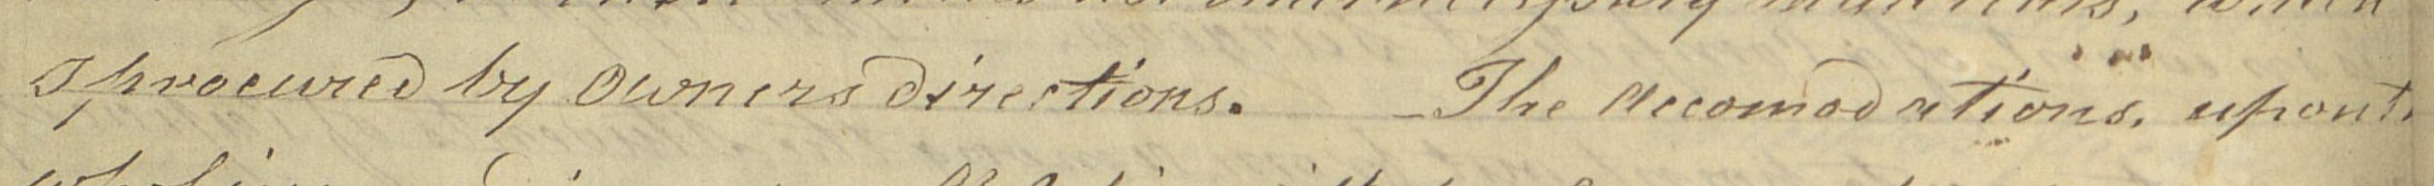I procured by owners directions. The accomodations, up onto
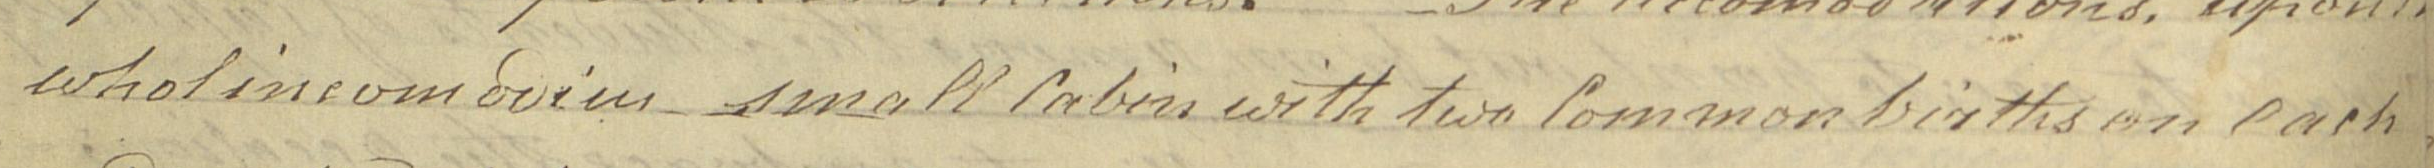whol incomodius small cabin with two Common births in each
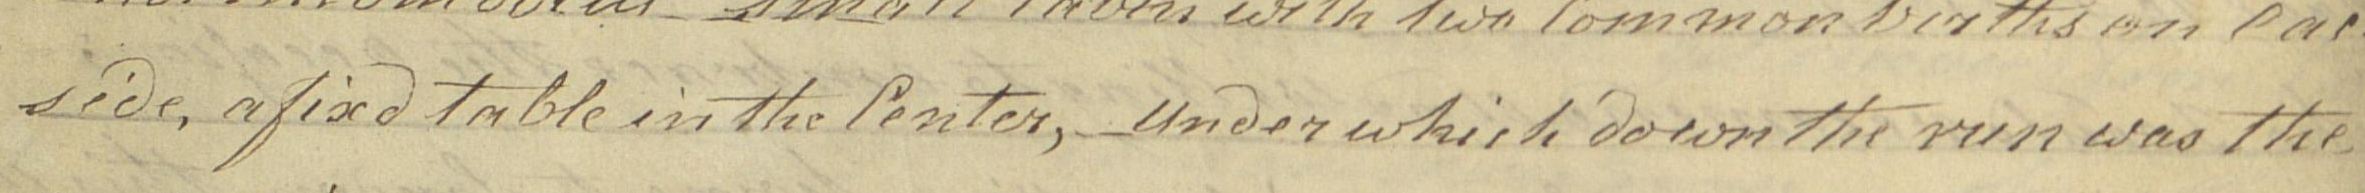side, afixd table in the Center, Under which down the run was the
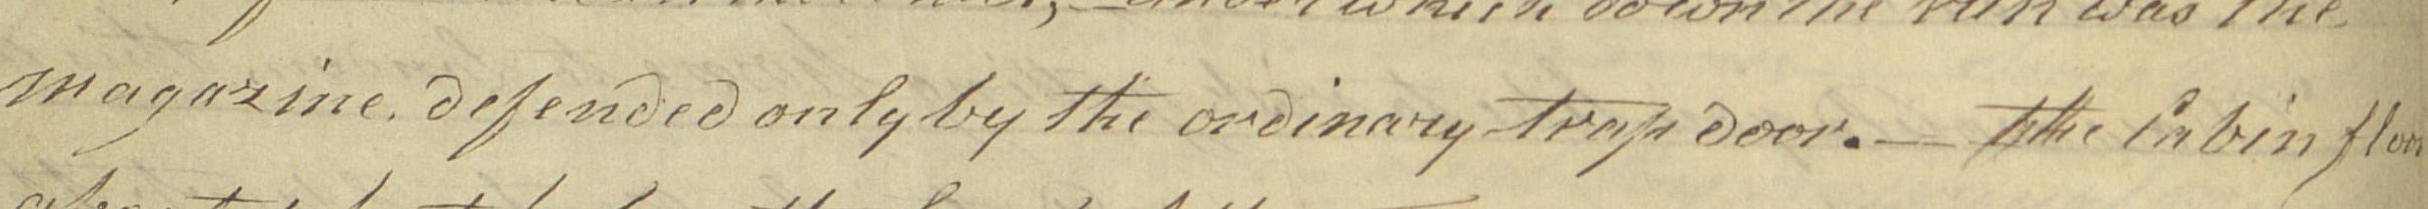magnazine defended only by the ordinary trap door. the Cabin floor
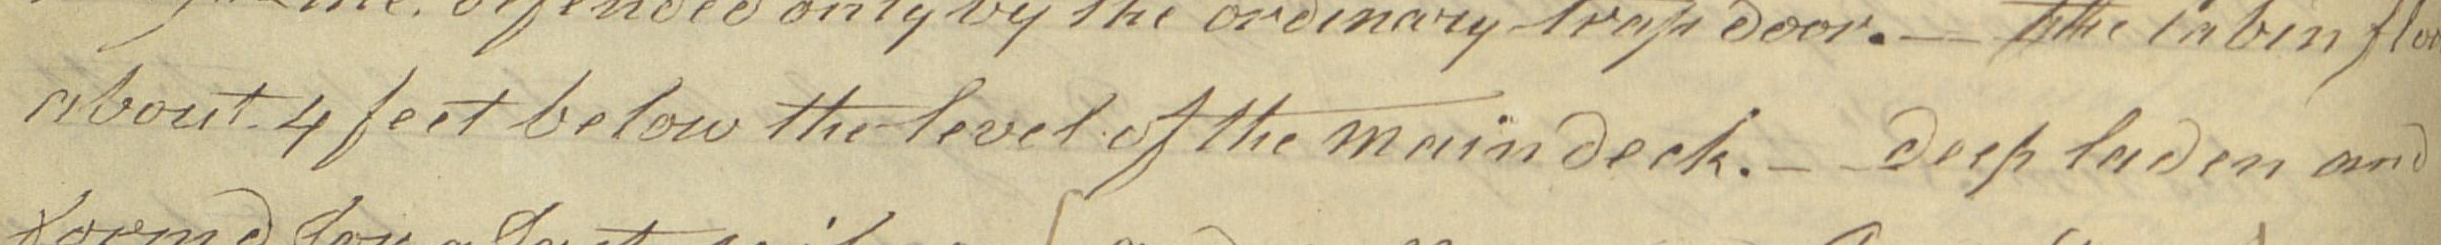about 4 feet below the level of the main deck. deep laden and
